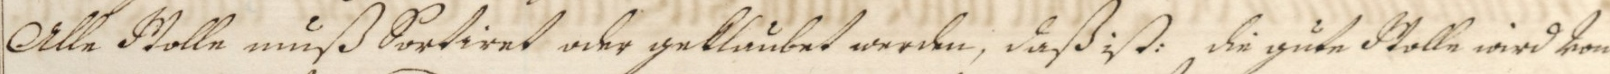Alle Wolle muß Sortiret oder geklaubet werden, daß ist: die gute Wolle wird von
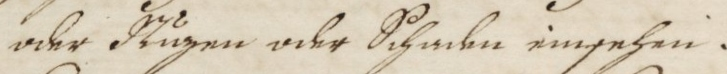oder Nuzen oder Schaden einsehen.
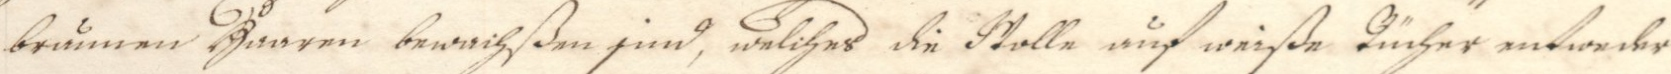braunen Haaren bewachßen sind, welches die Wolle auf weiße Tücher entweder
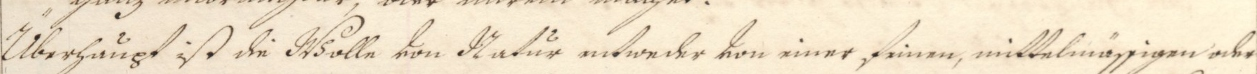Überhaupt ist die Wolle von Natur entweder von einer feinen, mittelmässigen oder
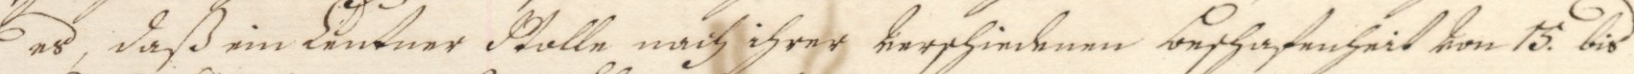es, daß ein Centner Wolle nach ihrer verschiedenen Beschafenheit von 15. bis
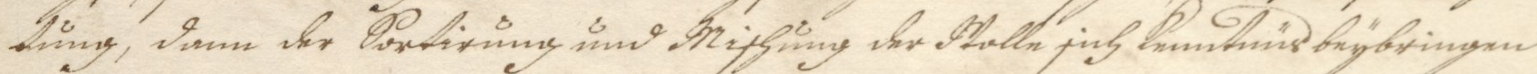tung, dann der Sortirung und Mischung der Wolle sich Kenntnüs beybringen
